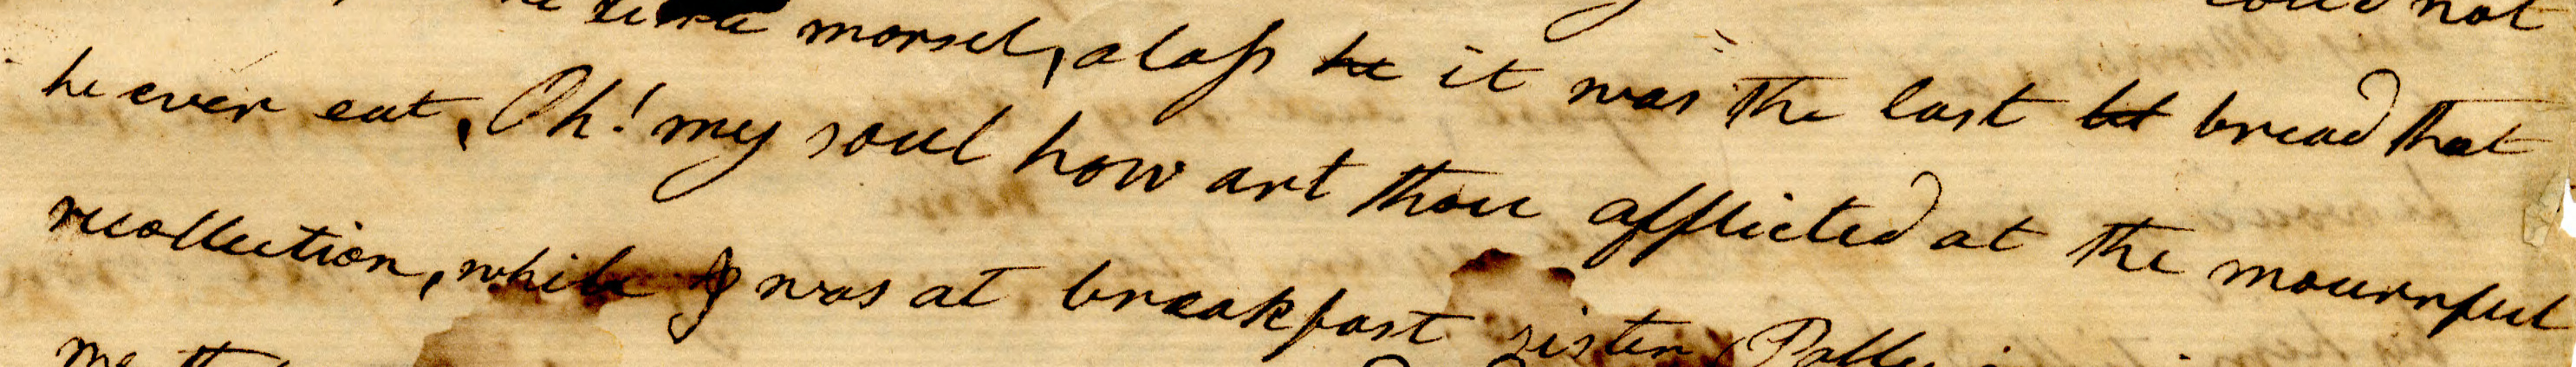he ever eat, Oh! my soul how art thou afflicted at the mournful
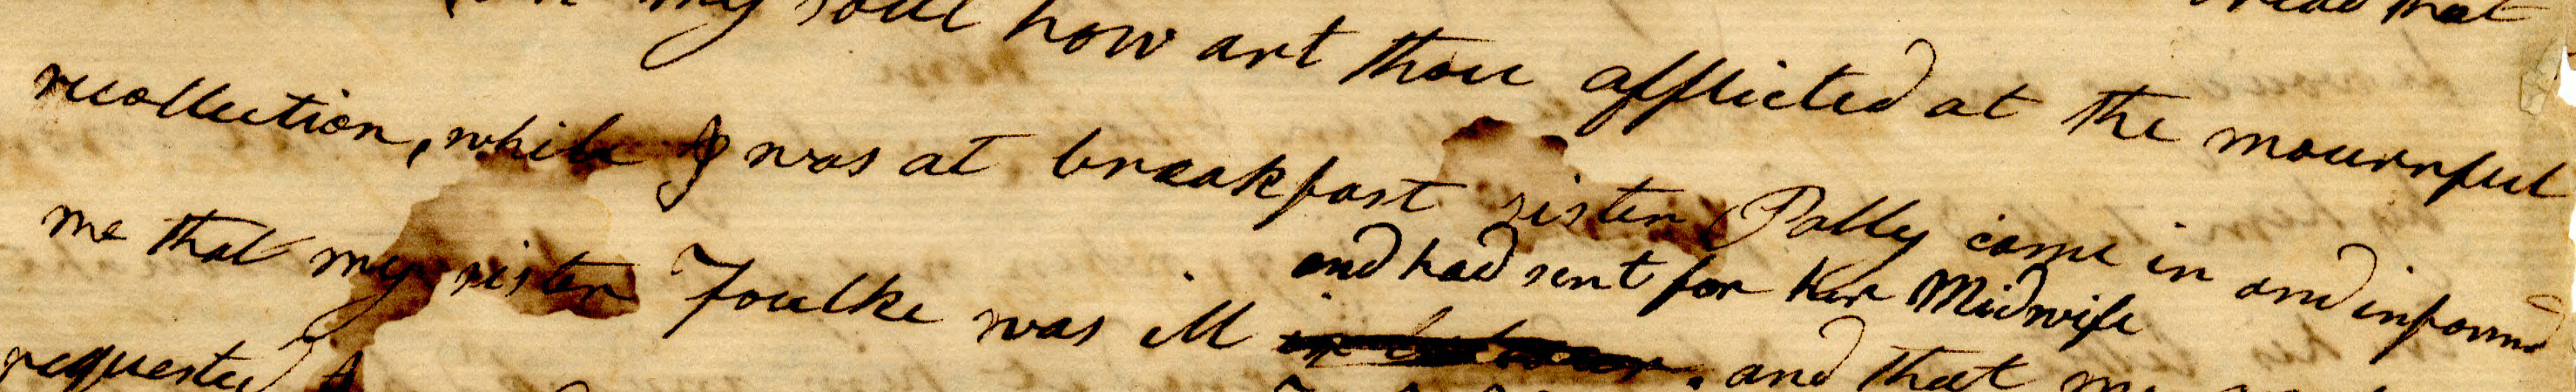recollection, while I was at breakfast sister Polly came in and informd
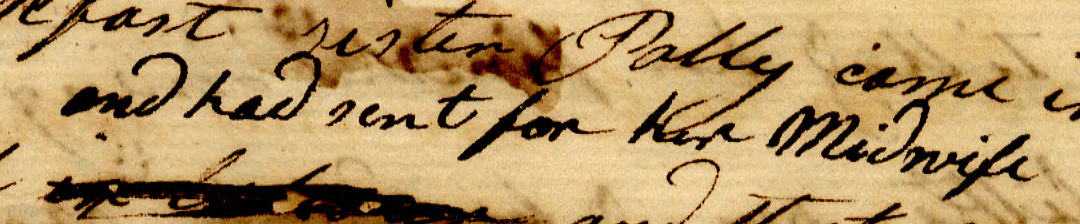and had sent for her Midwife
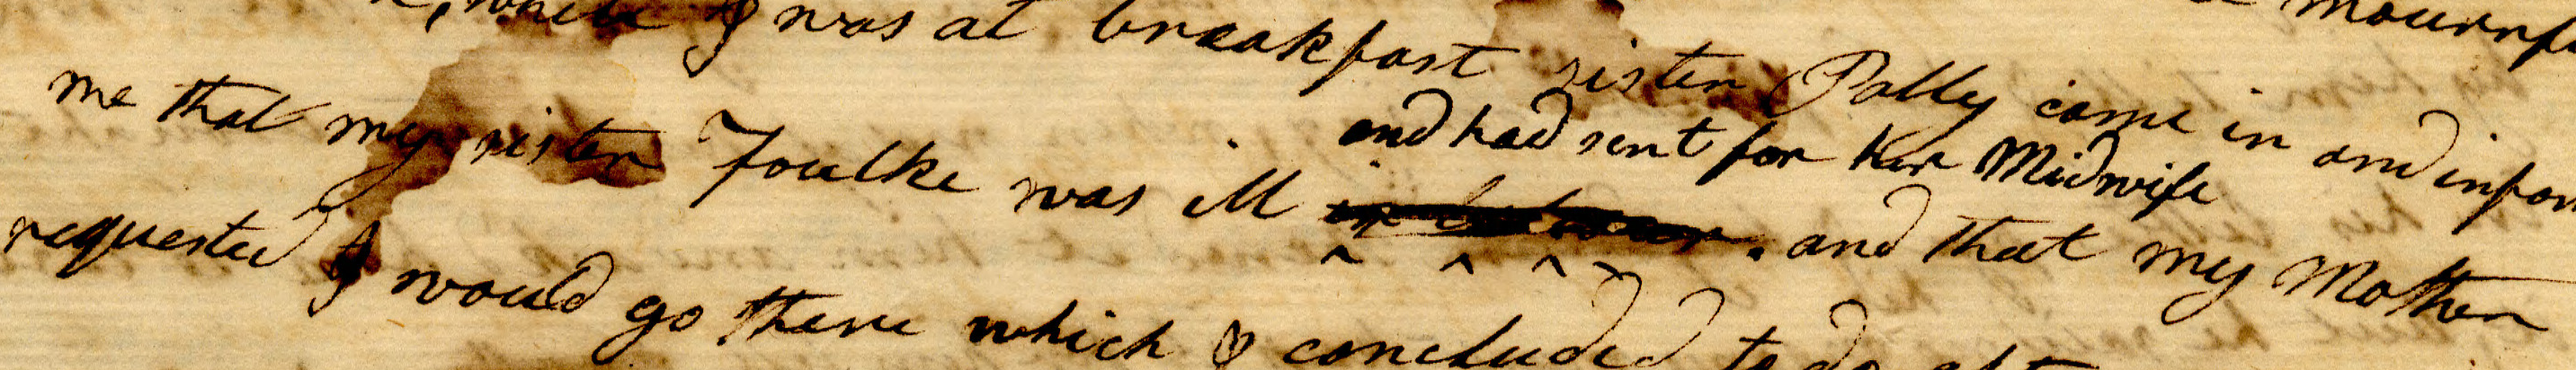me that my sister Foulke was ill ^ ^ ^ [________] and that my Mother
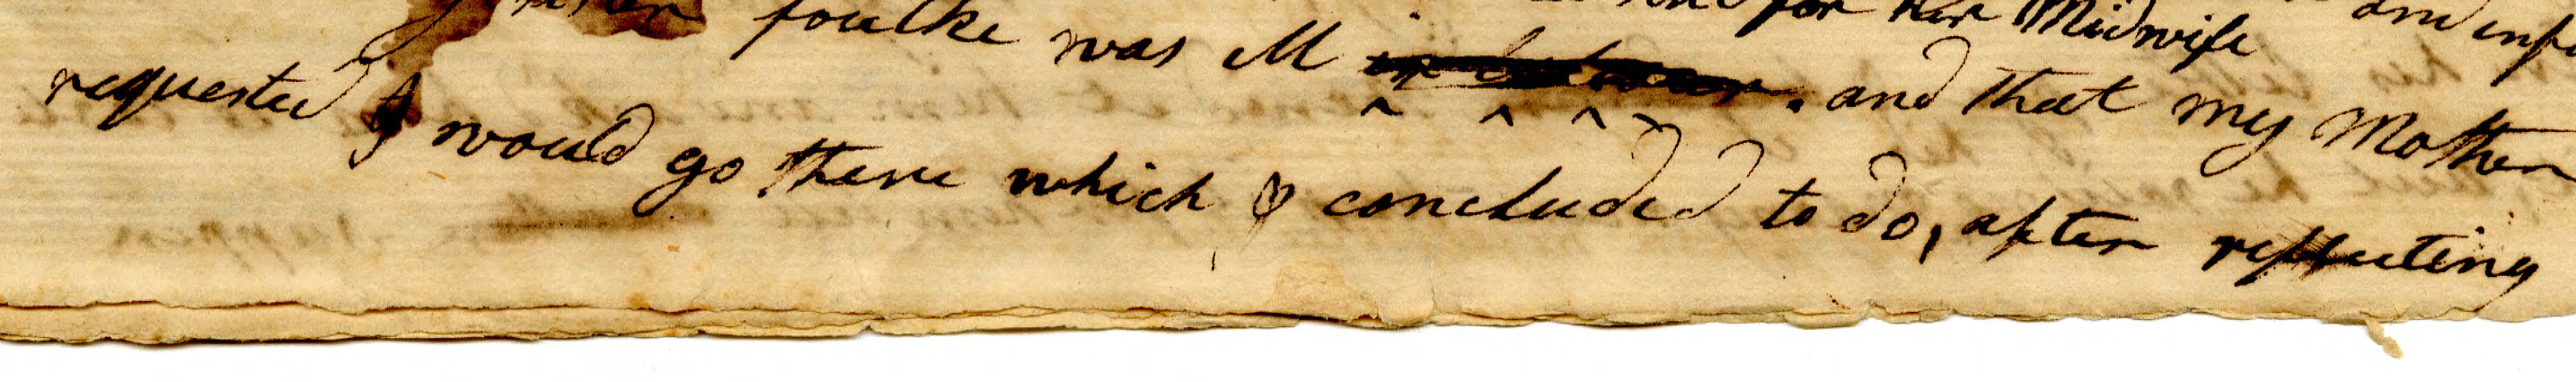requested I would go there which I concluded to do, after reflecting
